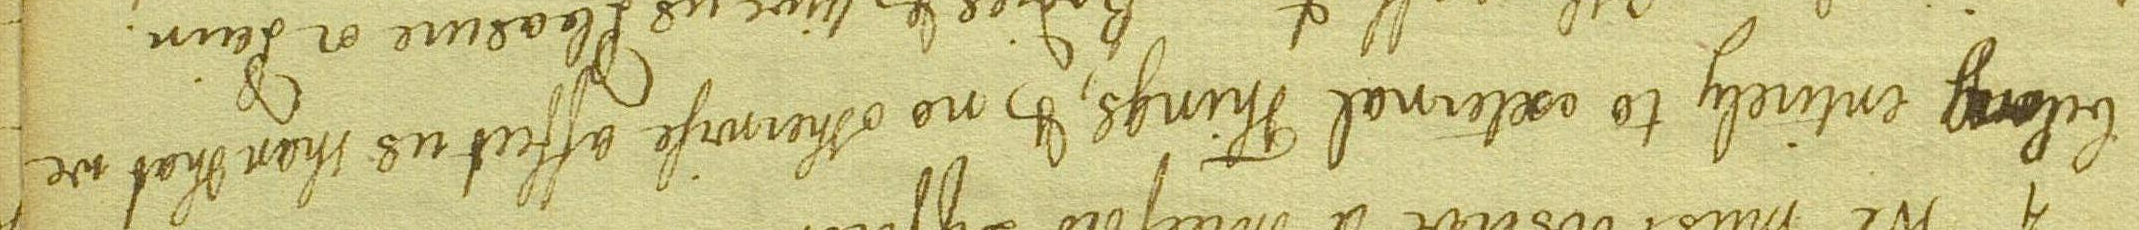belong entirely to external Things, & no otherwise affect us than that we
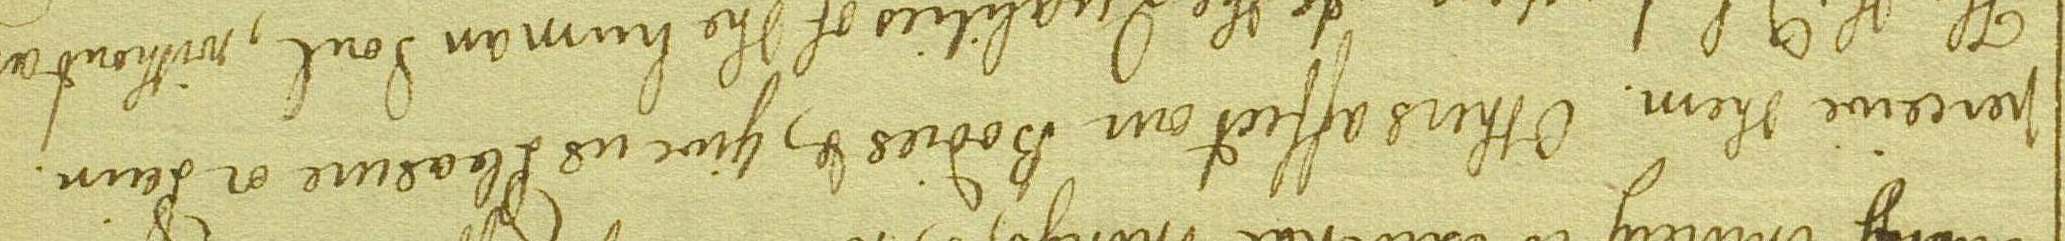perceive them. Others affect our Bodies & give us Pleasure or Pain.
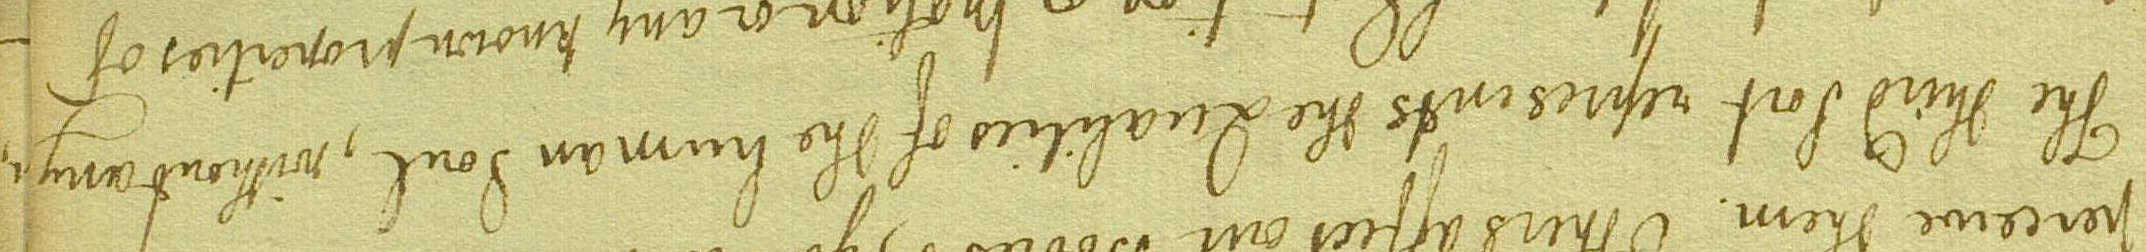The third Sort represents the Qualities of the human soul, without any
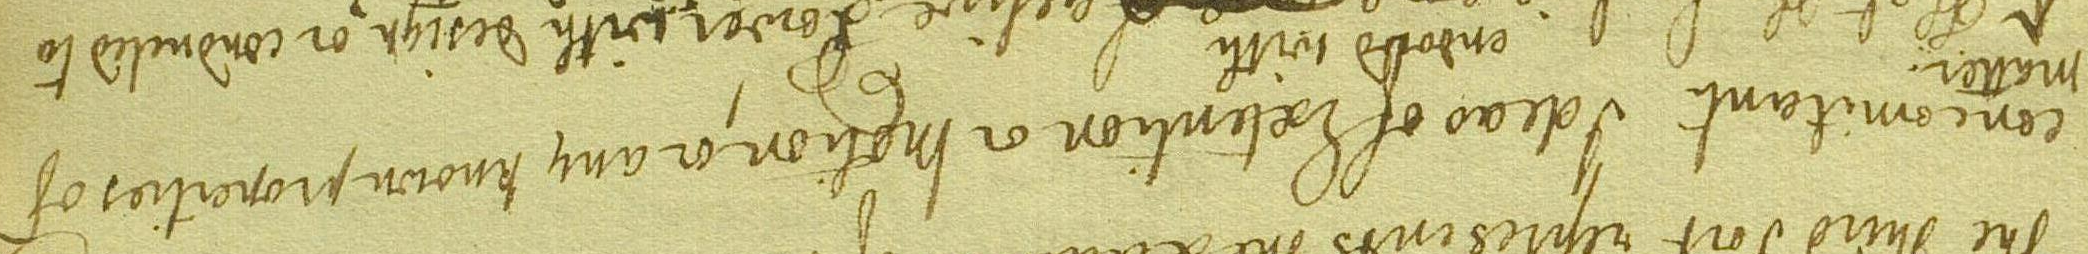concomitant Ideas of Extention or motion, or any known properties of
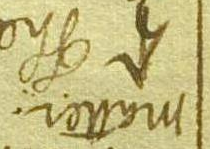matter.
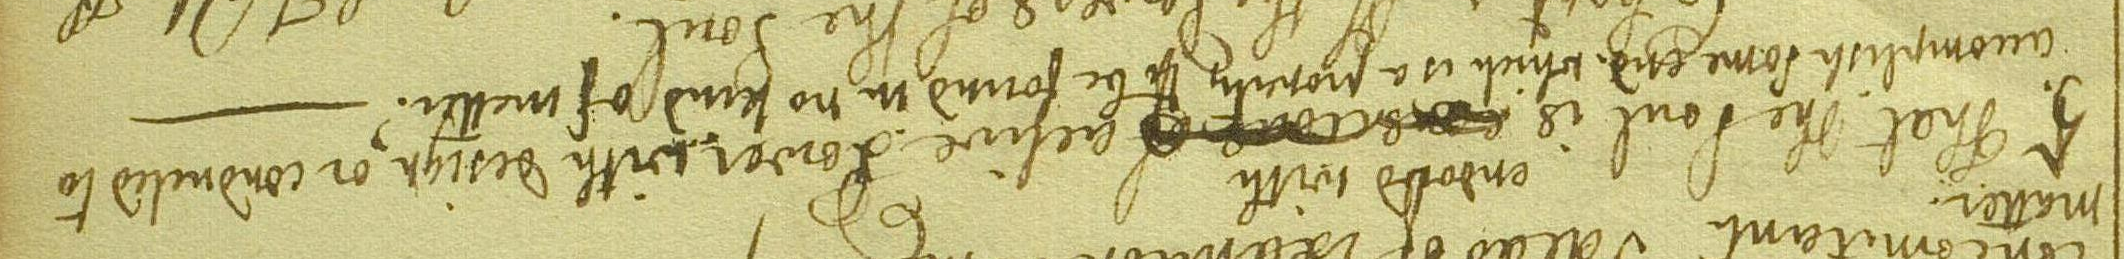5. That the soul is ^ [__ _____ __] active Power with design, or conducted to
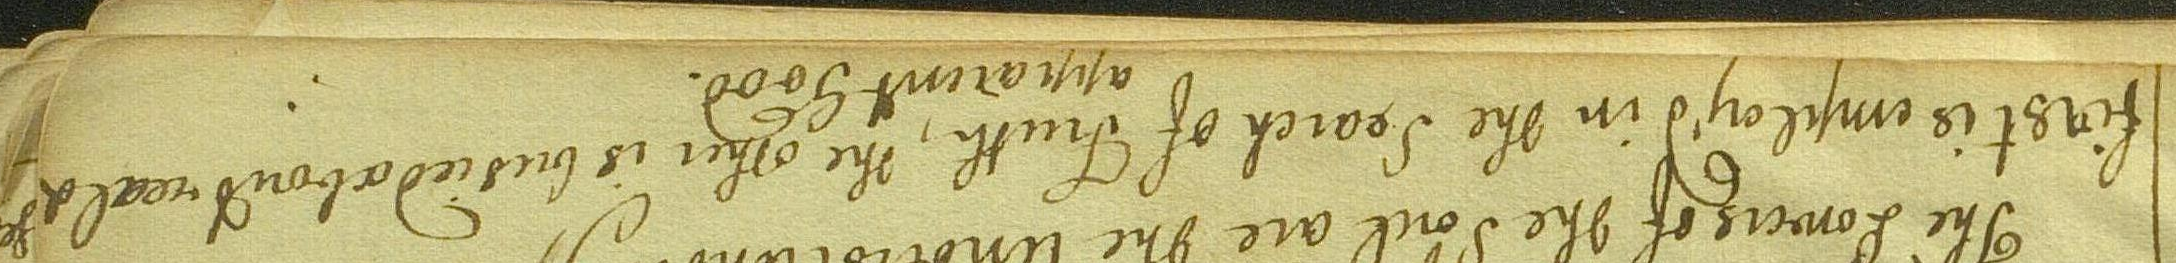first is employ'd in the Search of Truth, the other is busied about real &
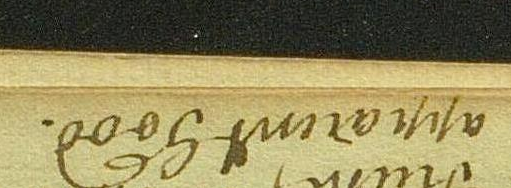apparent Good.
